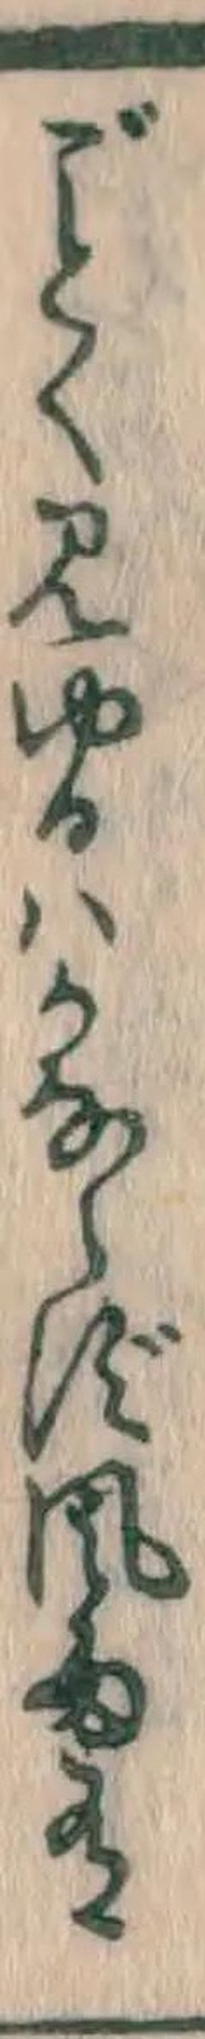ごとく見ゆるはかならず風雨有
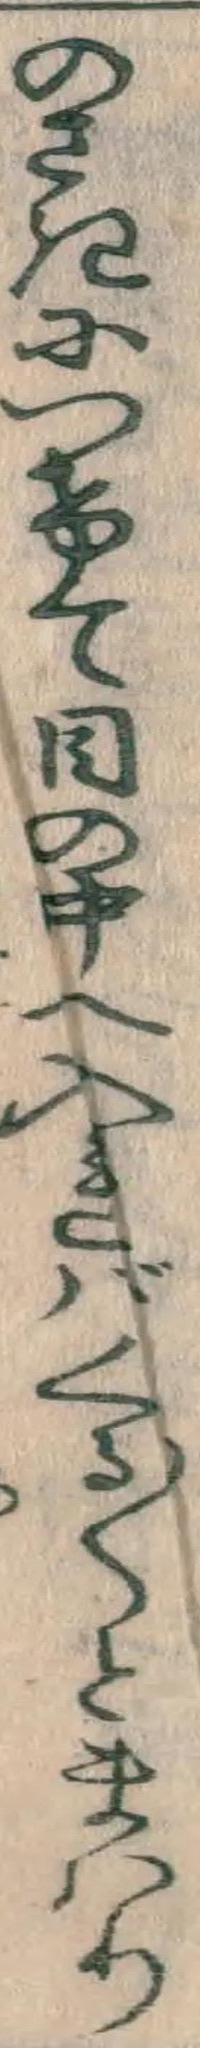のさきにつけて目の中へ入ればくる〳〵とまはり
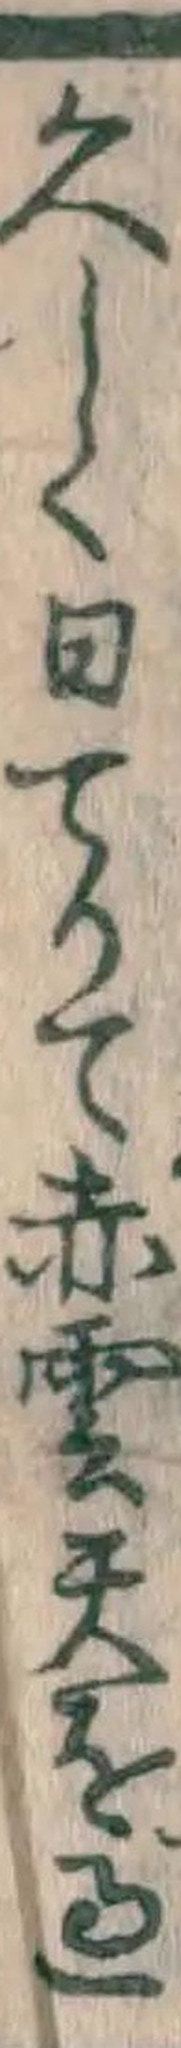久しく日てりて赤雲天を過
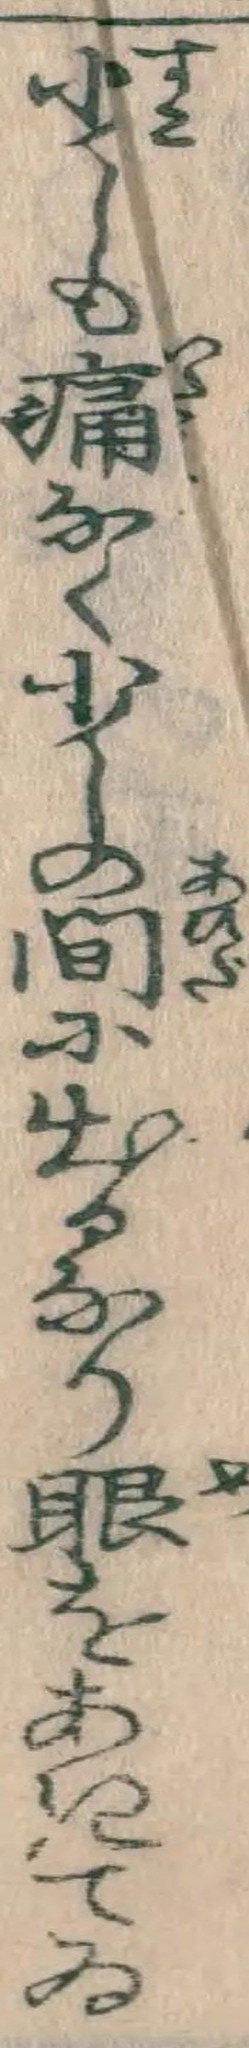少しも痛なく少しの間に出るなり眼をあきてゐ
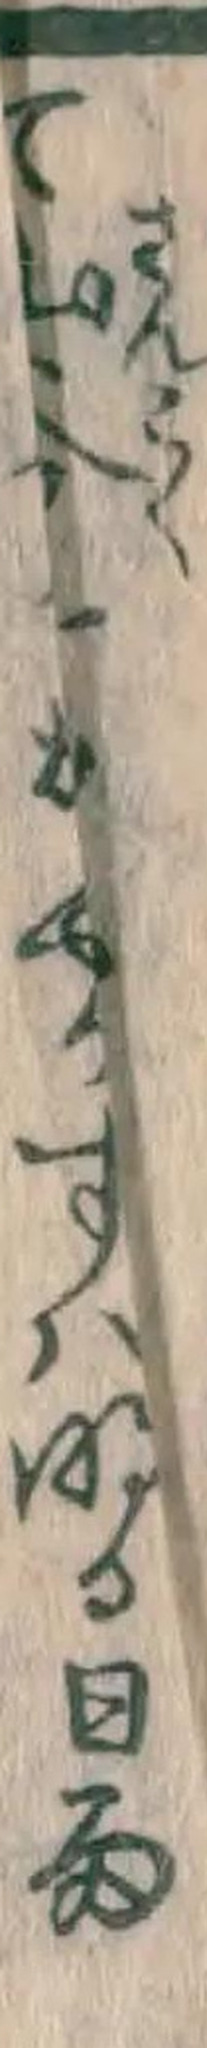て山谷をかゝやかすは明る日雨
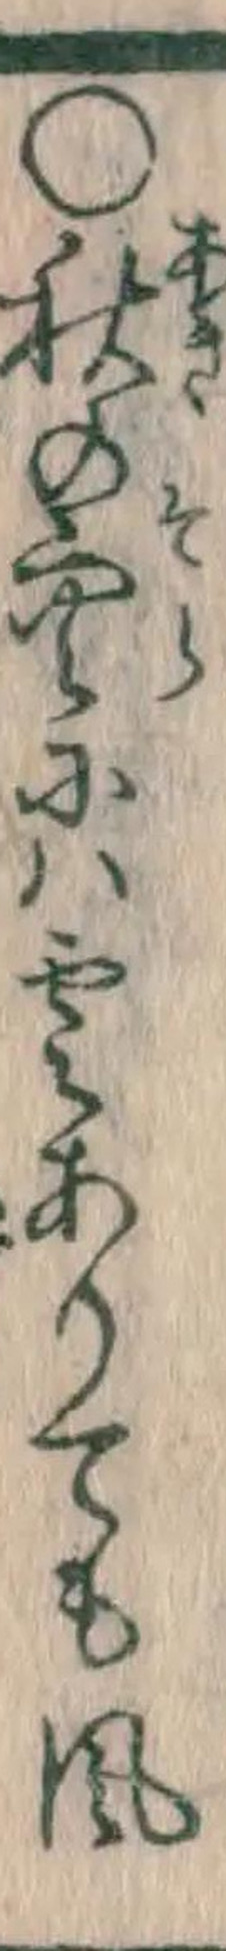○秋の空には雲ありても風
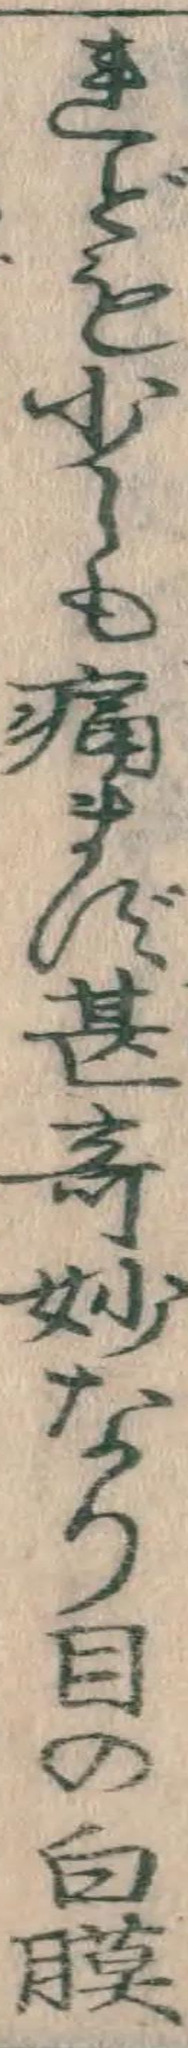れども少しも痛まず甚奇妙なり目の白膜
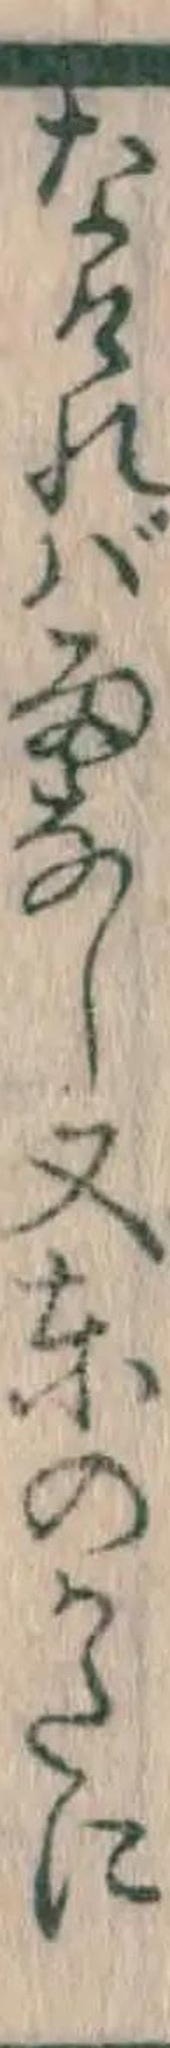なければ雨なし又東のかたに
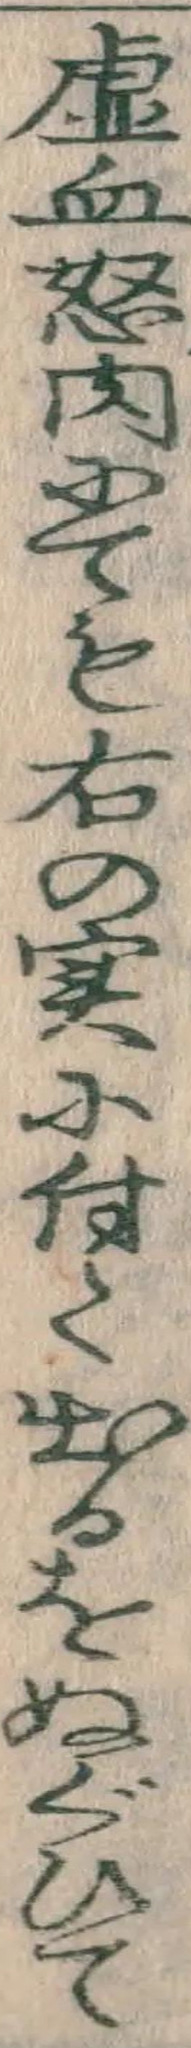虚血怒肉にても右の実に付て出るをぬぐひて
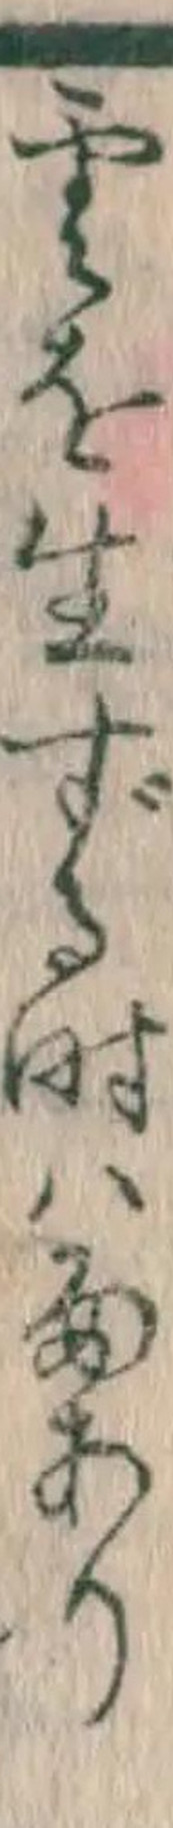雲を生ずる時は雨あり
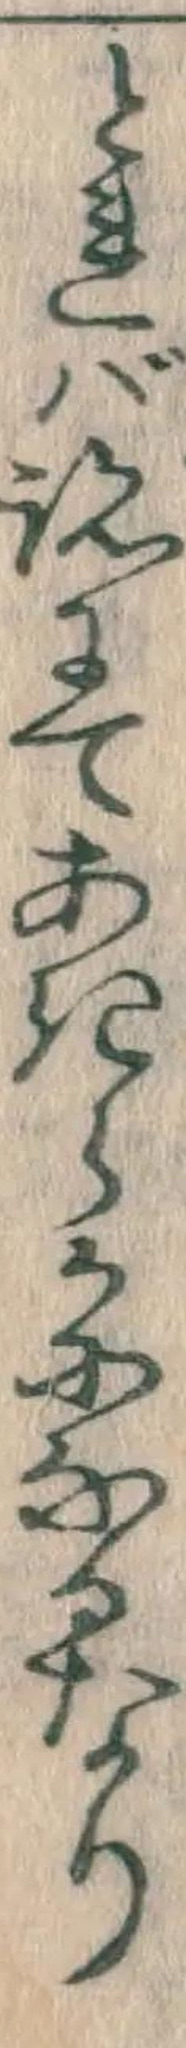とれば跡にてあきらかになるなり
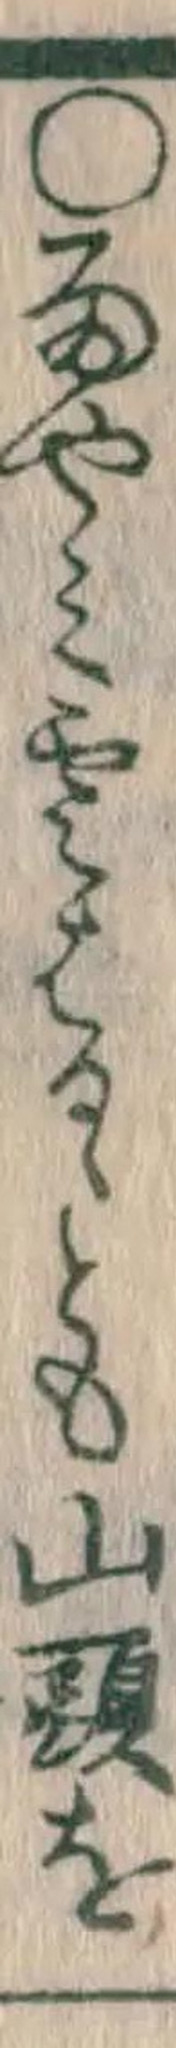○雨やみ雲はるゝとも山頭を
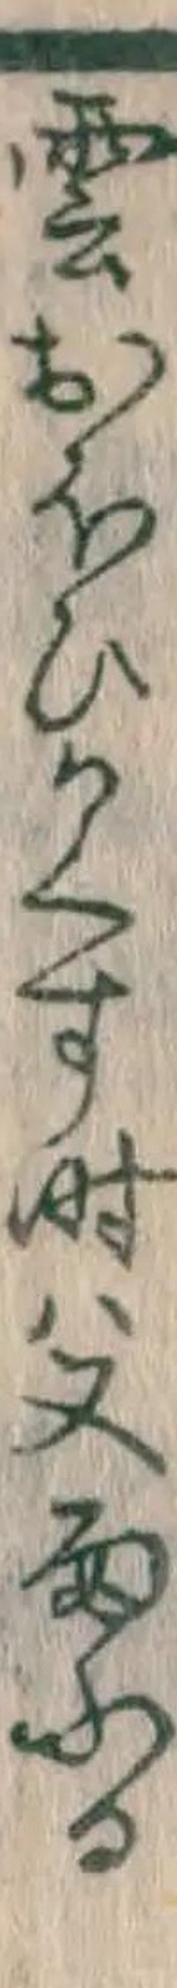雲おほひかくす時は又雨ふる
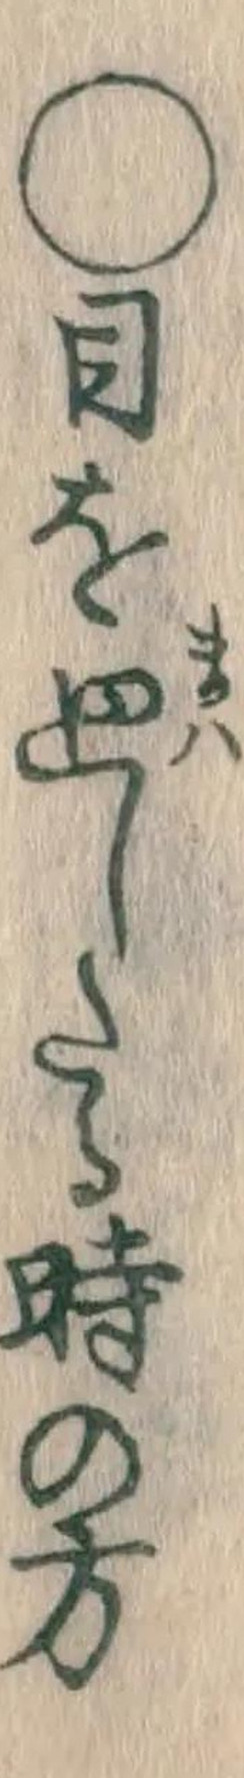○目を廻したる時の方
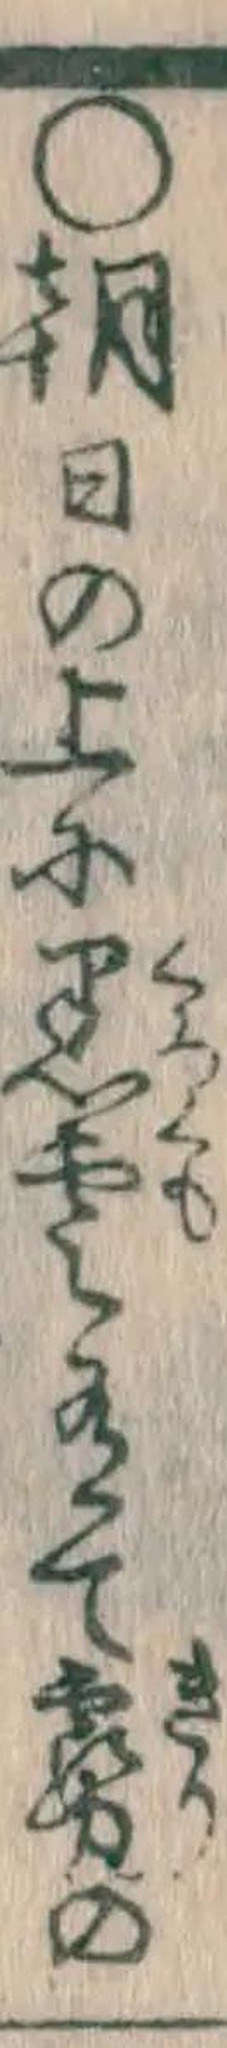○朝日の上に黒雲有て霧の
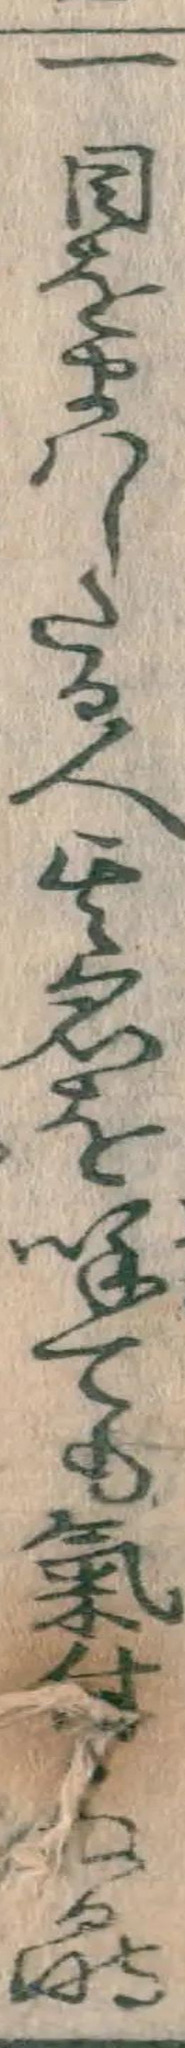一目をまはしたる人其名を呼ても気付かぬる時
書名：広益秘事大全 3巻. [4]
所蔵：国立国会図書館 National Diet Library, JAPAN
